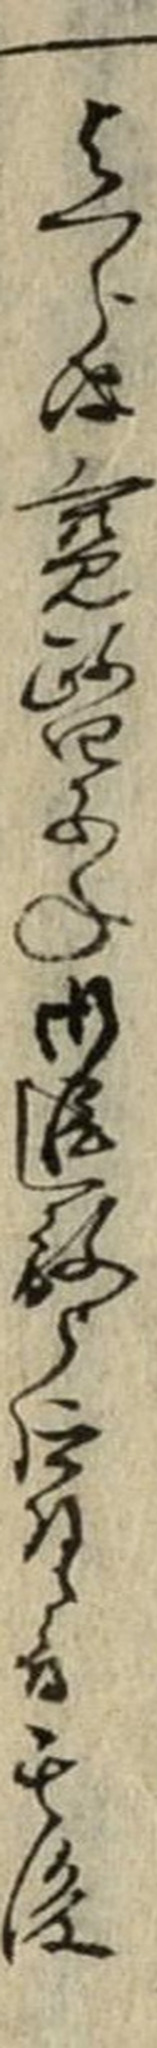与一郎儀寛政四子年御追放被仰付候ニ付其後
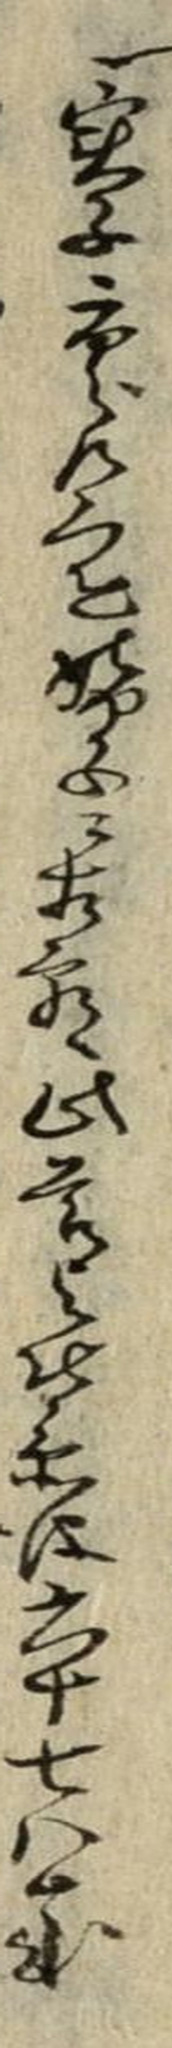実子市郎左衛門を嫡子ニ相成候此節与次兵衛儀六十七八歳
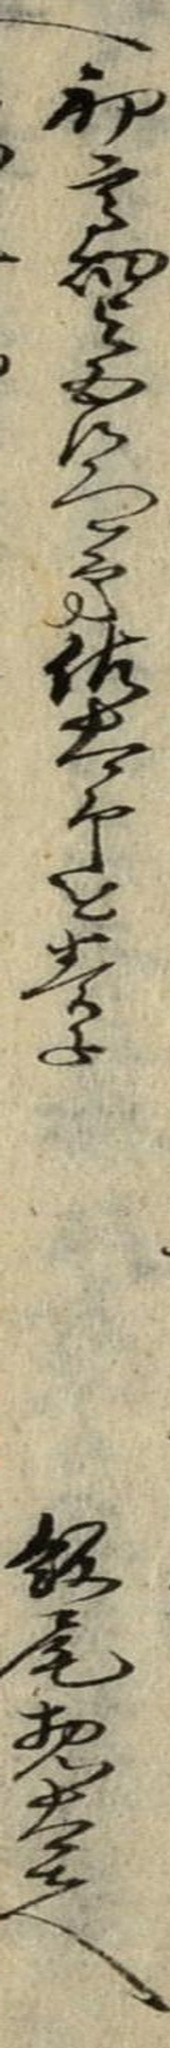初高畑与五左衛門弟佐太郎を養子飯尾惣太夫
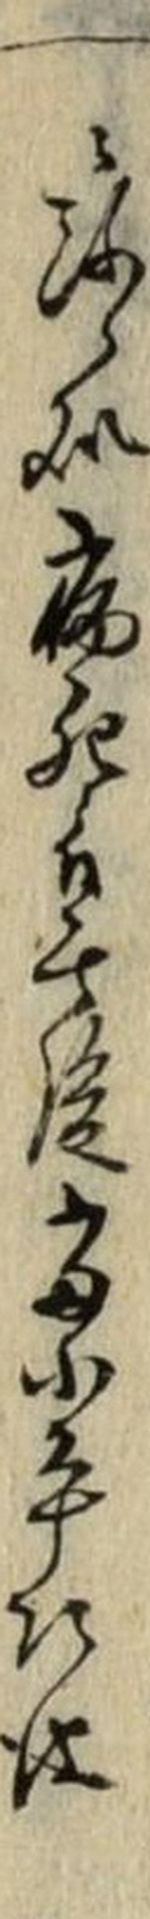ニ致候処病死ニ付其後当小平治儀
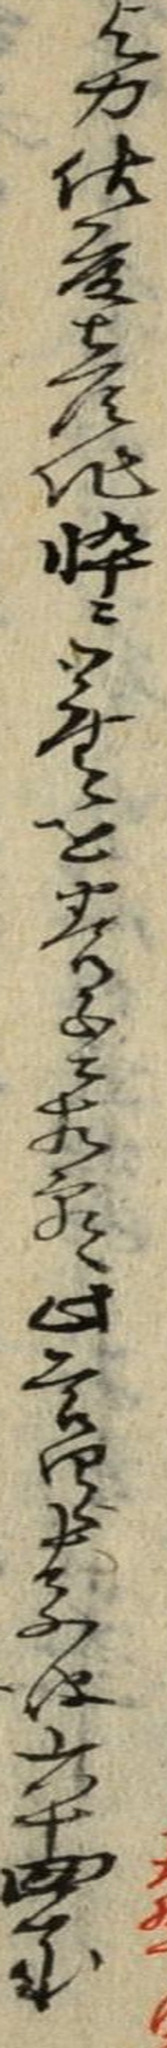与力佐藤彦作悴ニ御座候を養子ニ相願候此節四郎太夫儀六十四歳
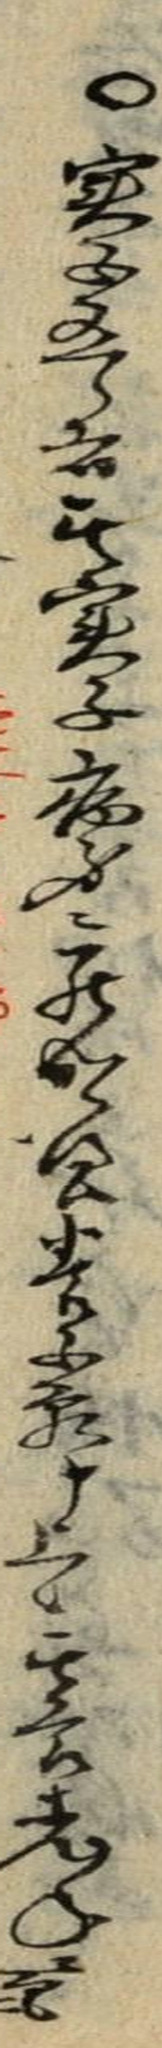〇実子有之者其実子病身ニ罷成候得ハ養子願申上候其節老年ニ而も
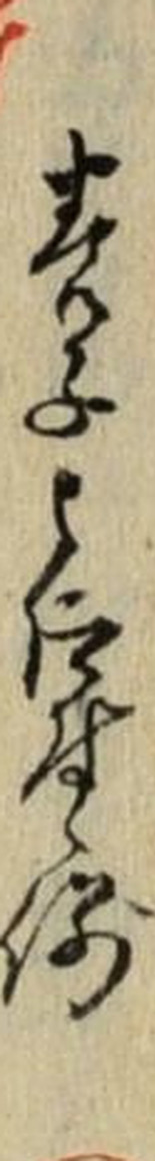養子被仰付候例
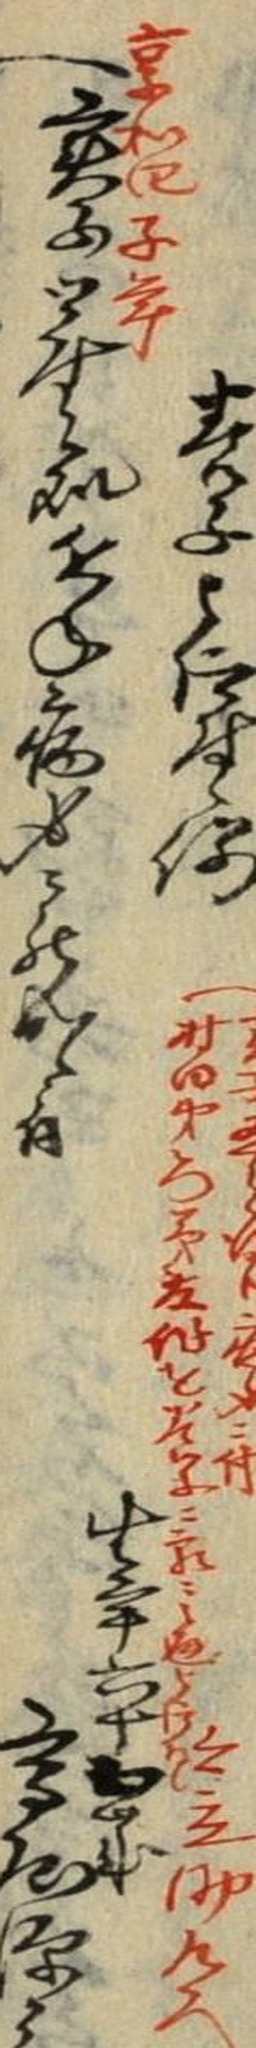実子御座候処近年病身ニ罷候ニ付生年六十四歳
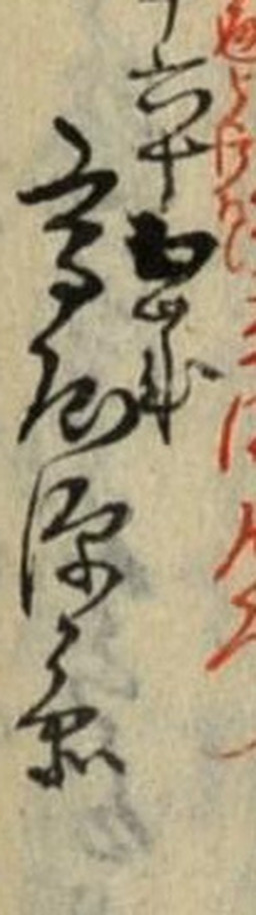高屋源兵衛
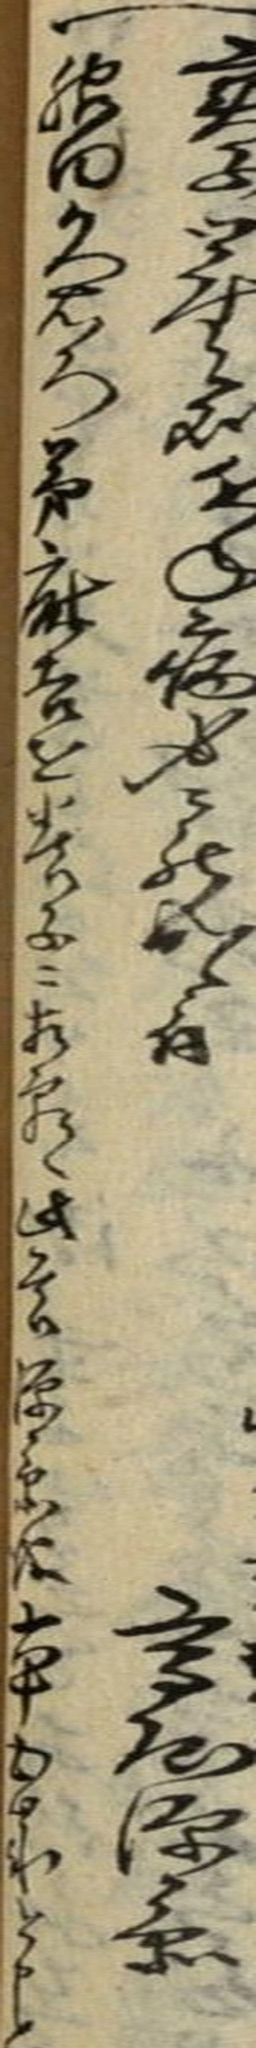脇田久右衛門弟麻吉を養子ニ相願候此節源兵衛儀六十五歳と申上候
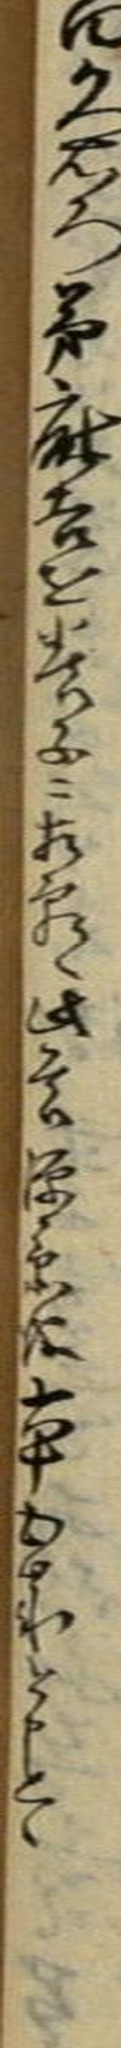脇田久右衛門弟麻吉を養子ニ相願候此節源兵衛儀六十五歳と申上候
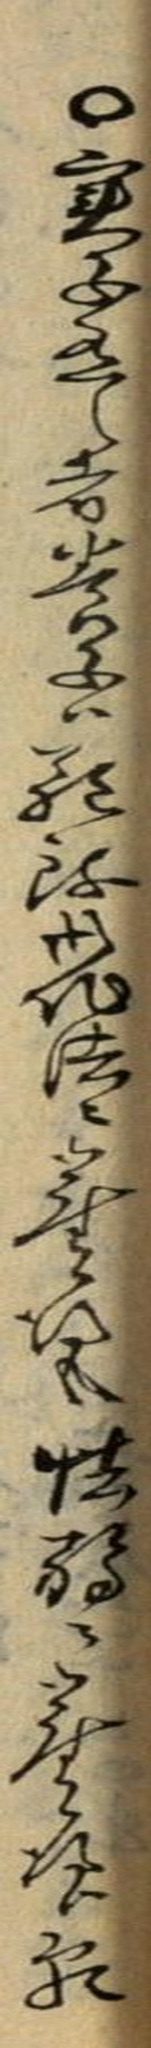〇実子有之者養子ハ難致御作法ニ御座候得共怯弱ニ御座候得ハ願
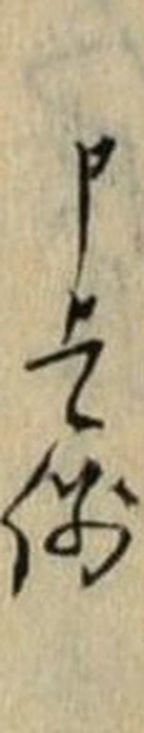申上候例
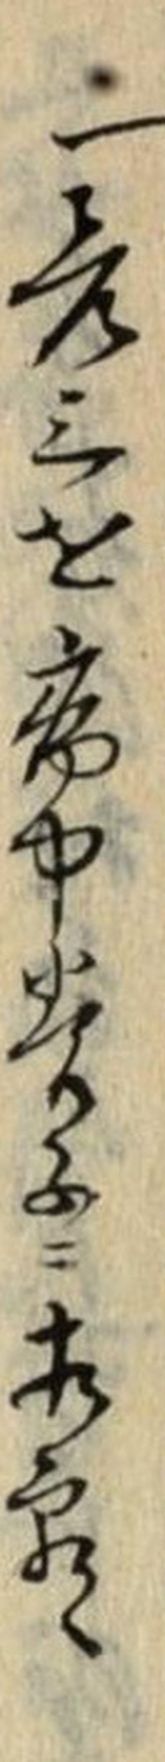彦三を病中養子ニ相願候
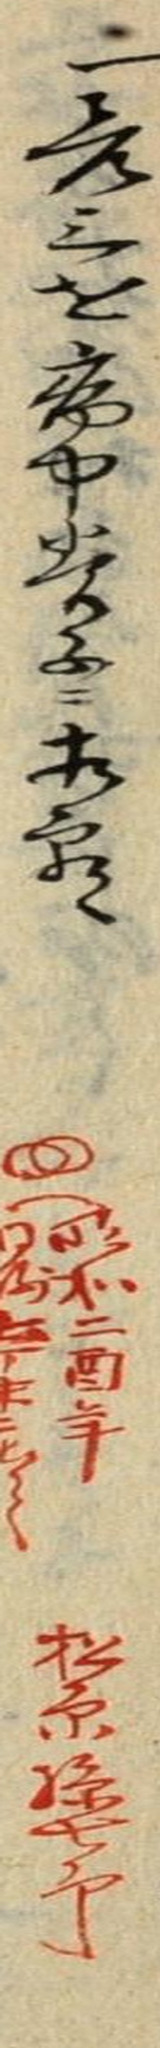彦三を病中養子ニ相願候
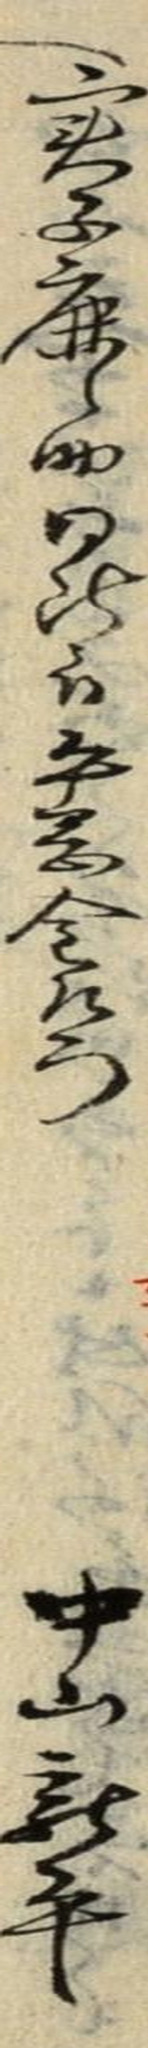実子鹿之助同断ニ付平岡金左衛門中山新平
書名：養子縁組之部
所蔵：福井県文書館 Fukui Prefectural Archives
